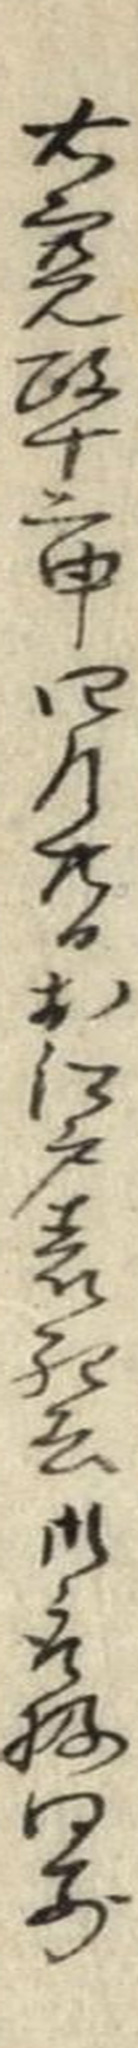右寛政十二申四月廿日於江戸表死去御取扱同前
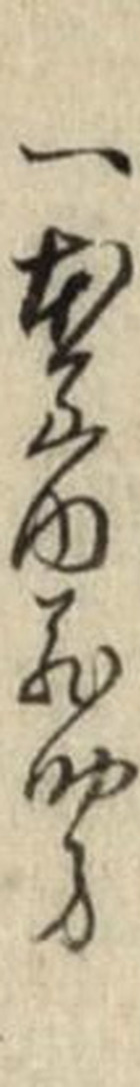一本多内蔵助方
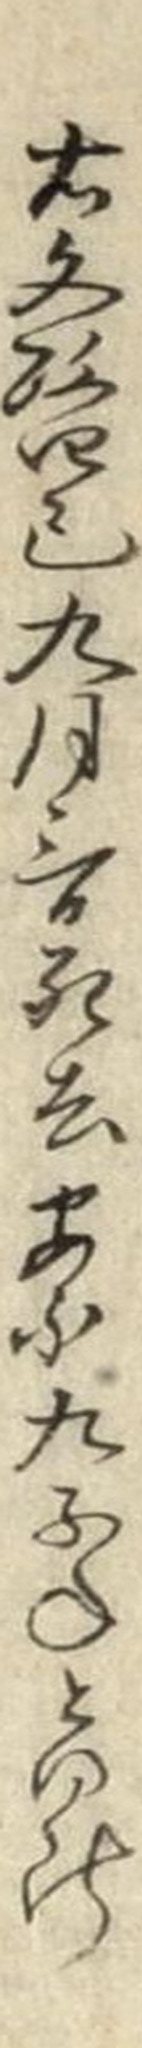右文政四巳九月三日死去安永九子年と同断
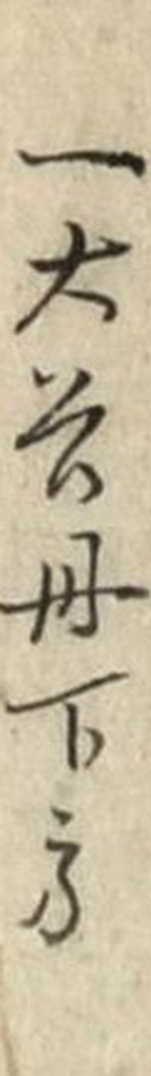一大谷丹下方
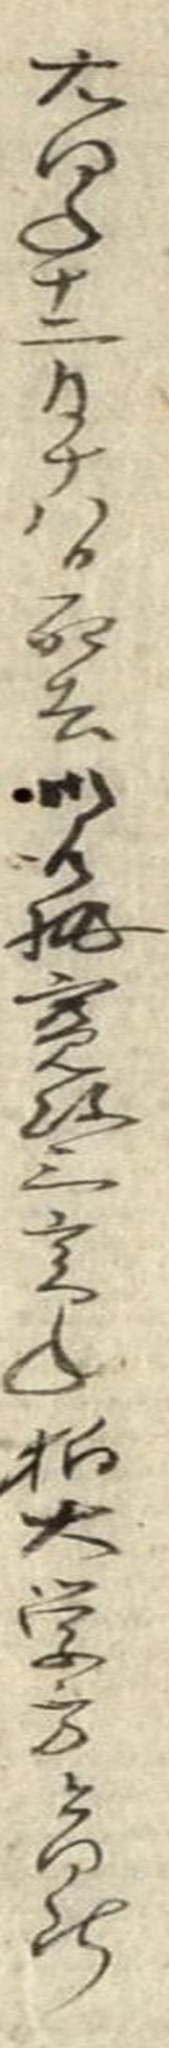右同年十二月十八日死去御取扱寛政三亥年狛大学方と同断
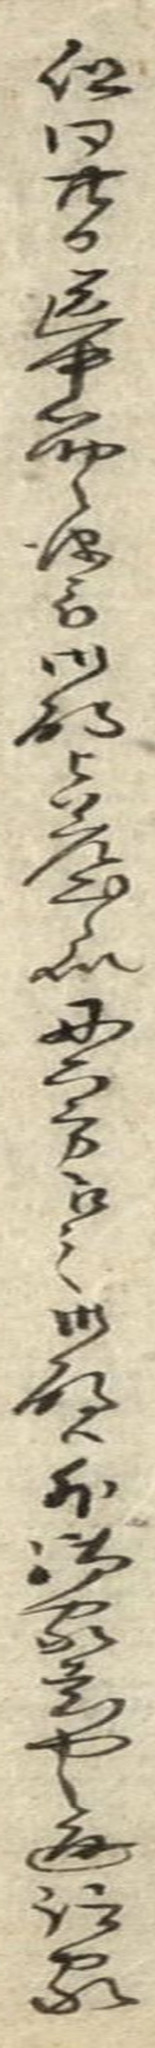但同廿日道中筋之儀に付御触被差出候処丹下方え之御触は外御家老中之通跡家
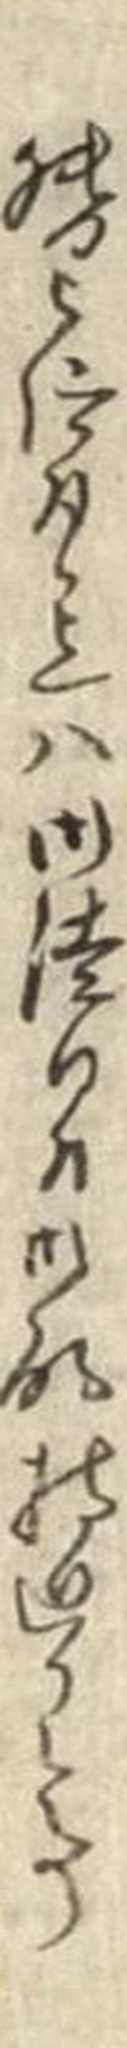督被仰付候迄は御徒目付御触持廻り之事
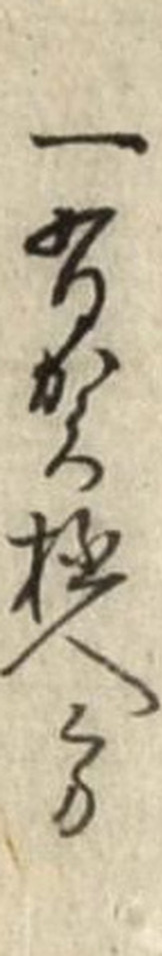一有賀極人方
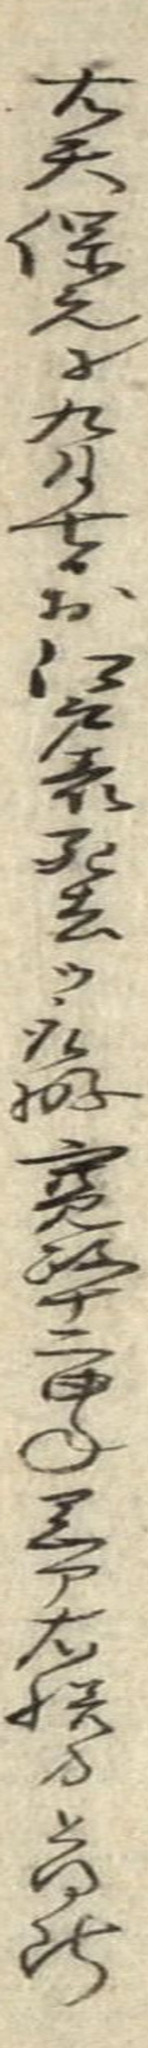右天保元刁九月七日於江戸表死去御取扱寛政十二申年岡部右膳方と同断
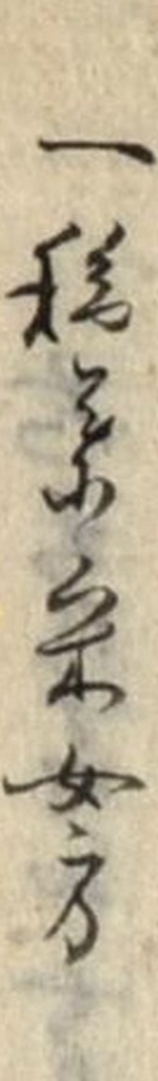一稲葉采女方
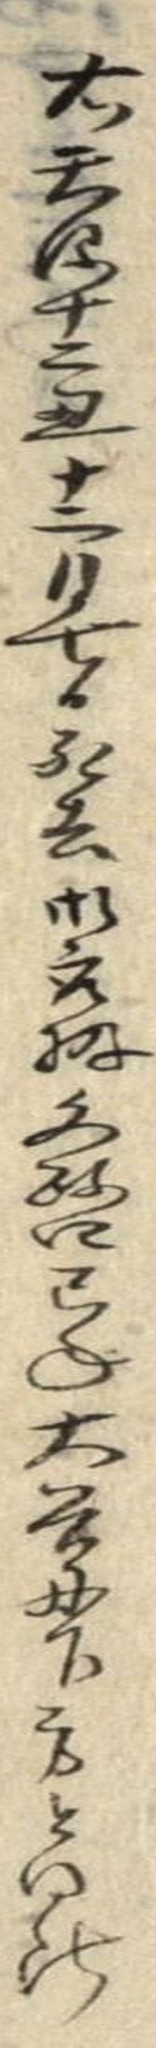右天保十二丑十二月七日死去御取扱文政四巳年大谷丹下方と同断

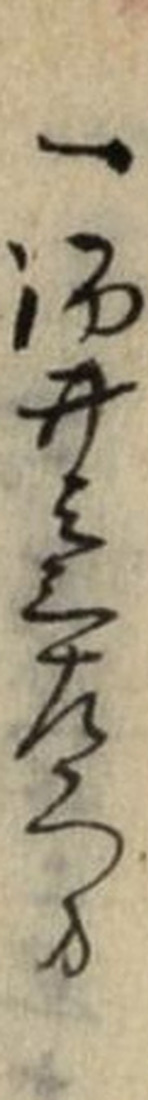一酒井与三左衛門方
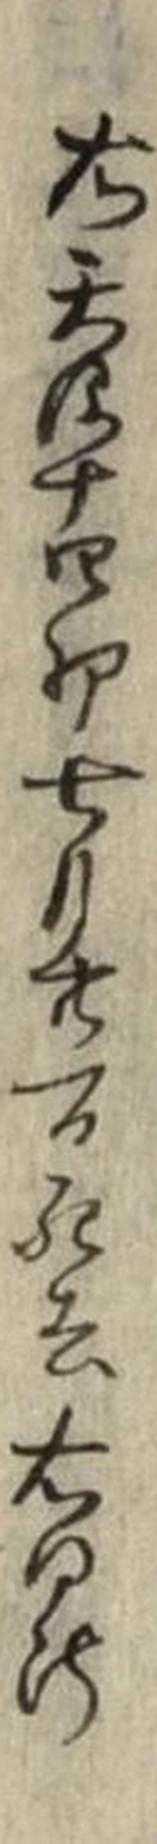右天保十四卯七月廿一日死去右同断

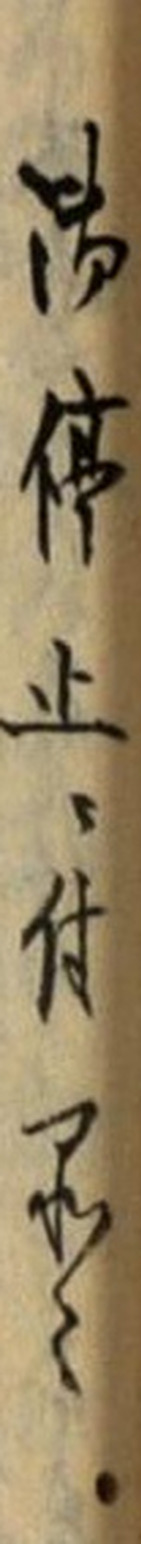御停止に付品々
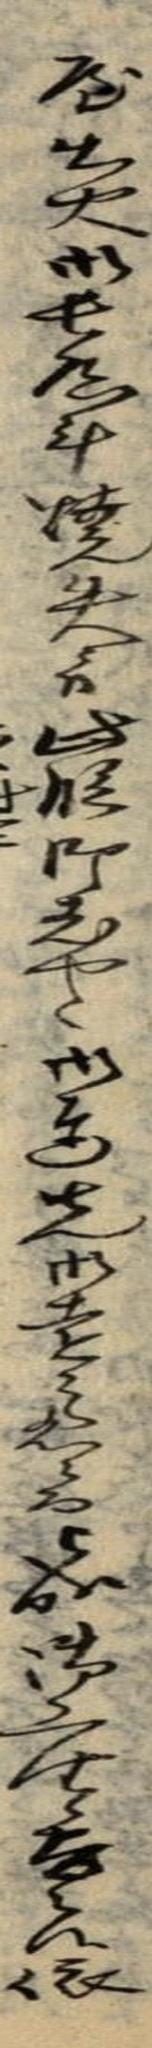屋出火御長屋斗焼失に付此段御老中へ御達先御遠慮にて被成御座候旨に候依
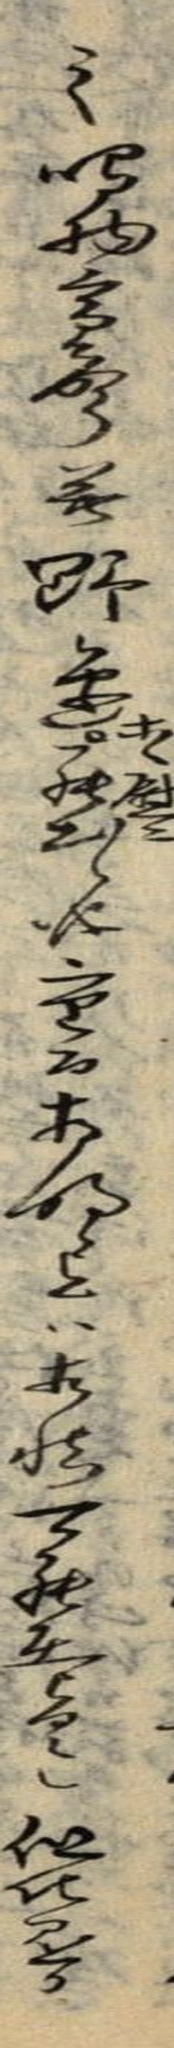之鳴物高声并野辺◦等へ慰に罷出候儀重て相触候迄は相慎可罷在旨に候但仕懸り
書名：御停止異変死失
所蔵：福井県文書館 Fukui Prefectural Archives
